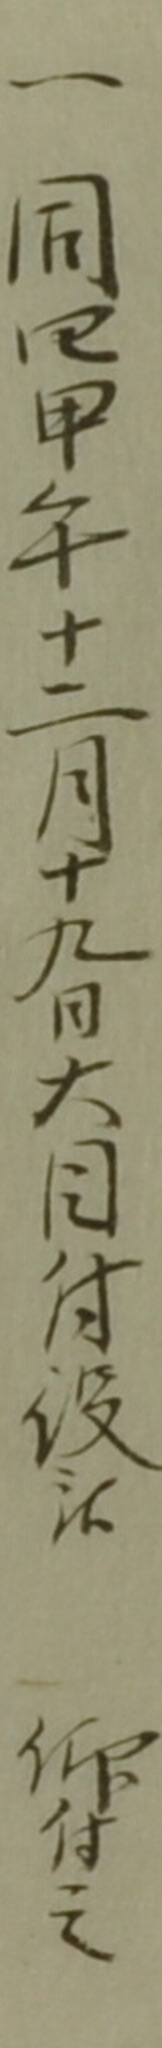一同四甲午十二月十九日大目付役被仰付之
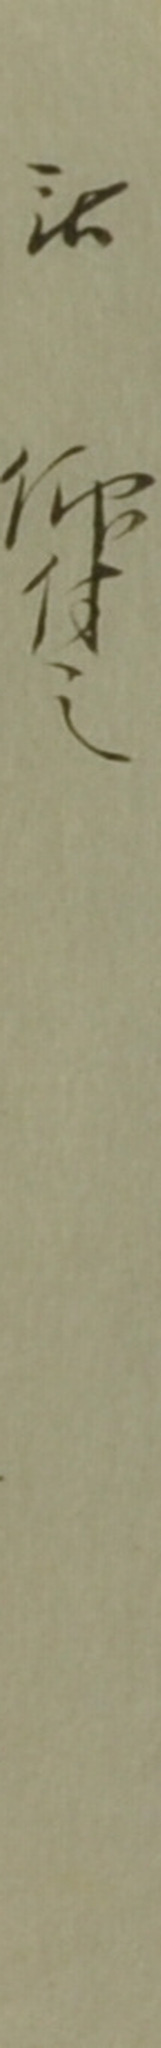被仰付之
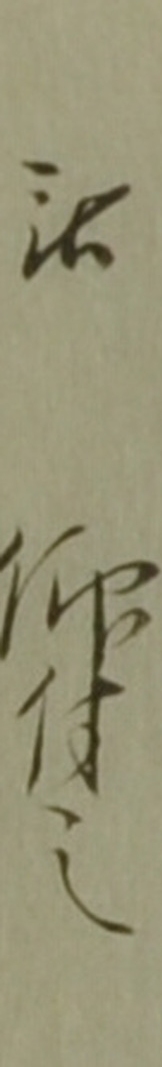被仰付之
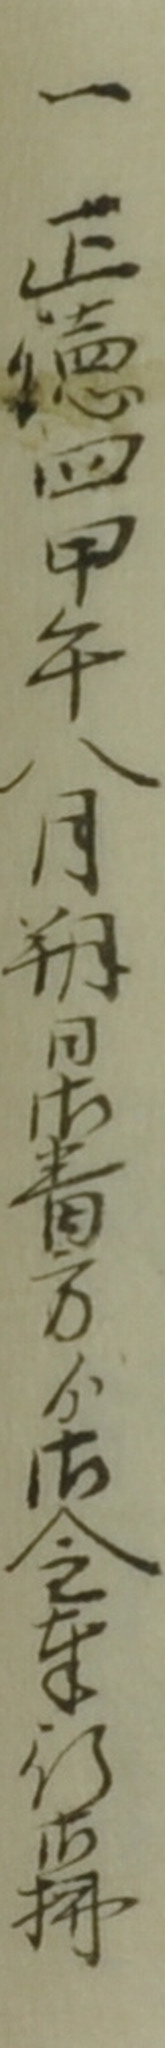一正徳四甲午八月朔日御番方ゟ御金奉行御払
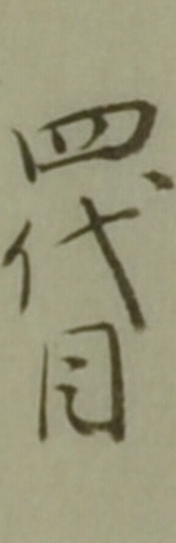四代目
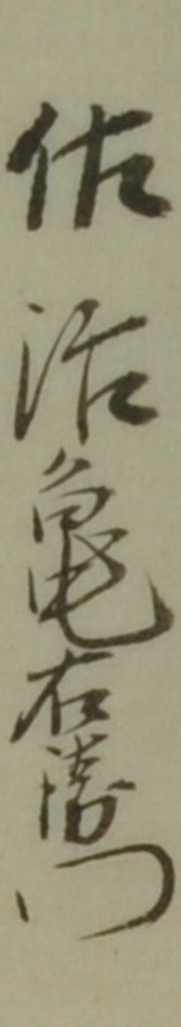佐治亀右衛門
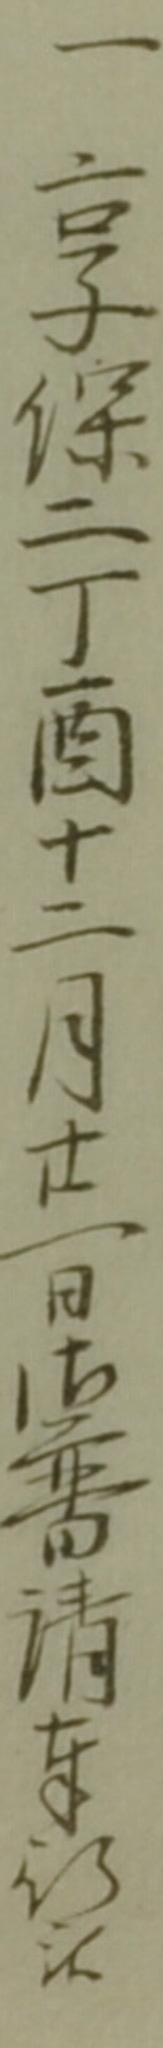一享保二丁酉十二月廿一日御普請奉行被
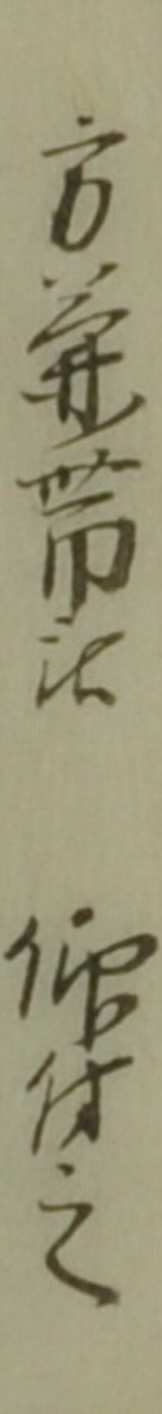方兼帯被仰付之
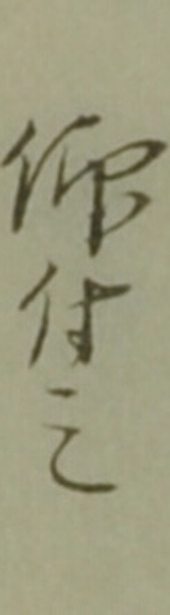仰付之
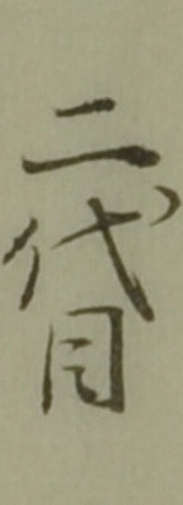二代目
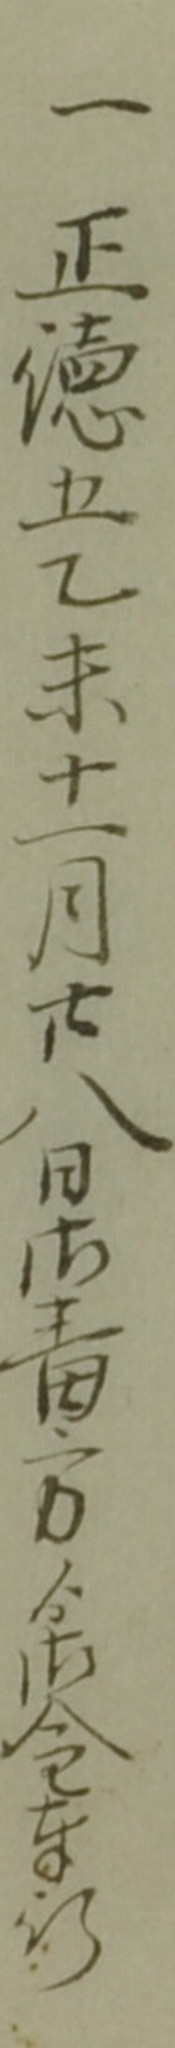一正徳五乙未十一月廿八日御番方ゟ御金奉行
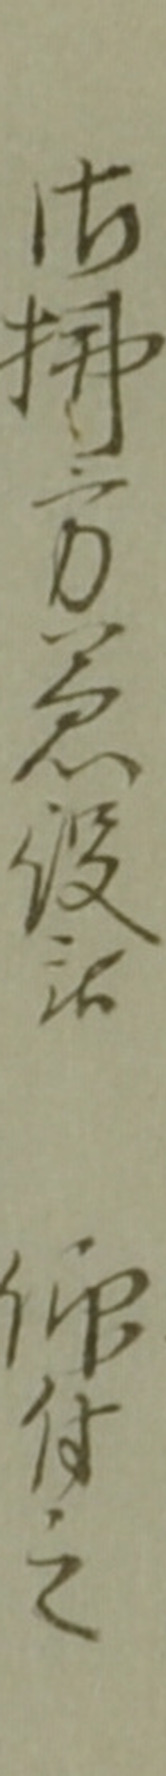御払方兼役被仰付之
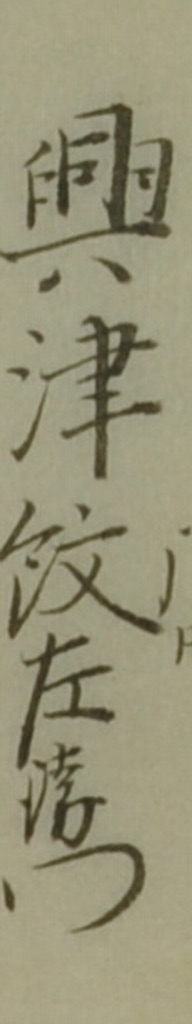興津紋左衛門
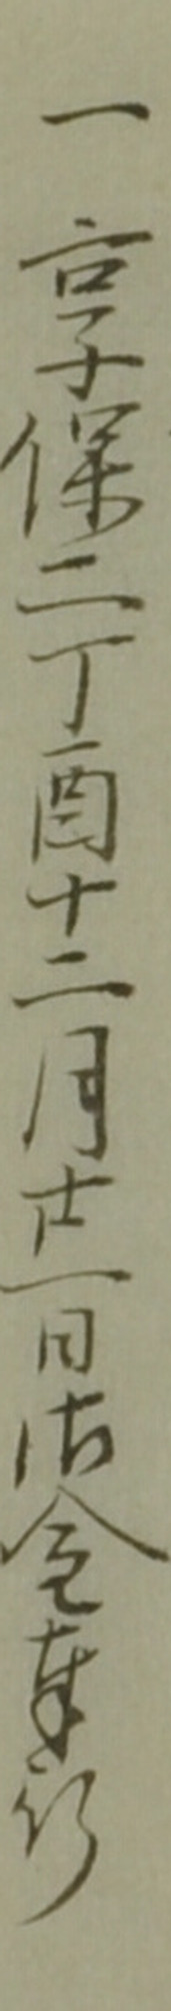一享保二丁酉十二月廿一日御金奉行
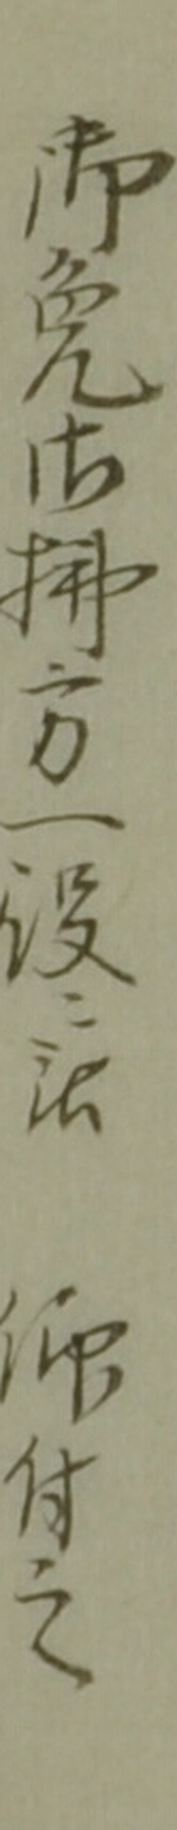御免御払方一役被仰付之
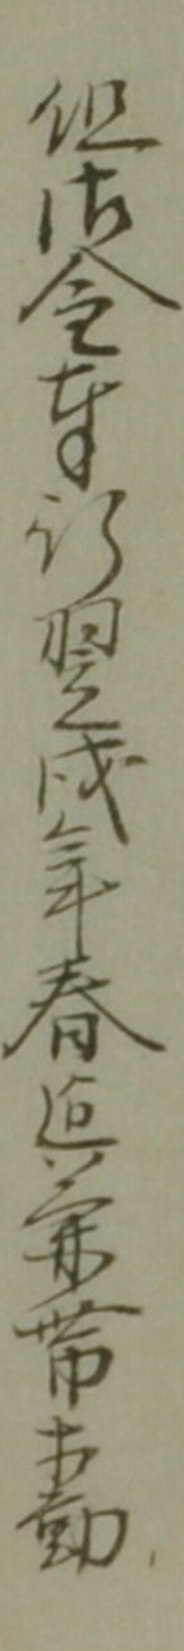但御金奉行翌戌年春迄兼帯相勤
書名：諸御役代々録（七）
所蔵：伊那市立高遠町図書館・合同会社AMANE
